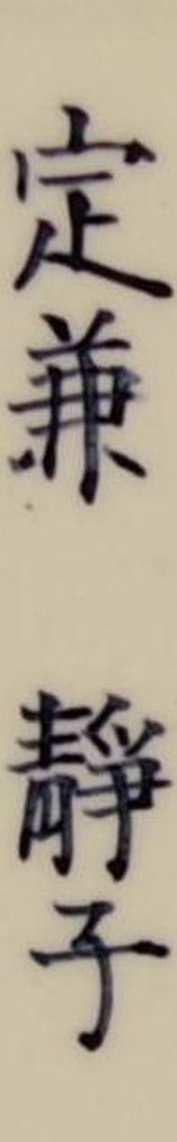定兼静子
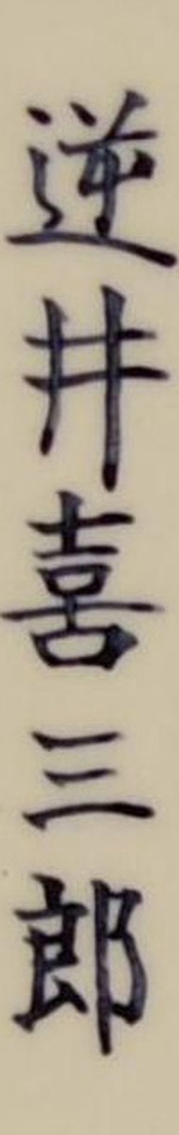逆井喜三郎
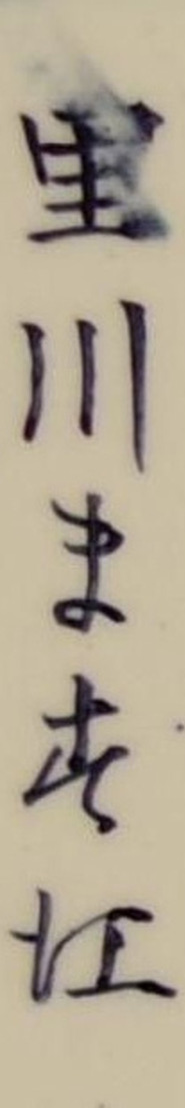里川ます江
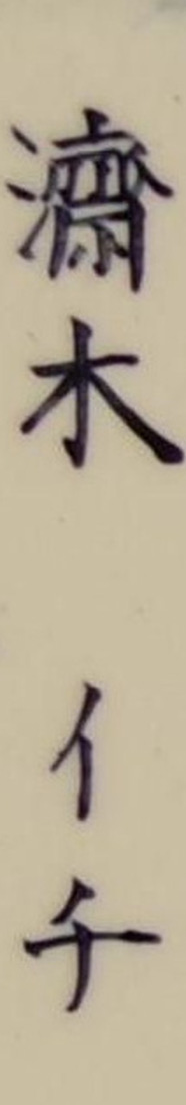済木イチ
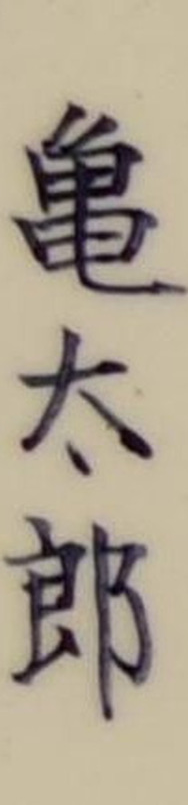亀太郎
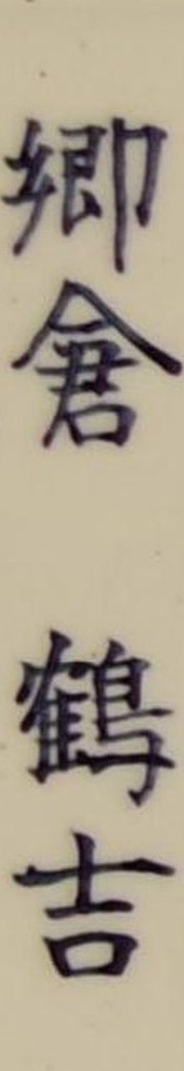郷倉鶴吉
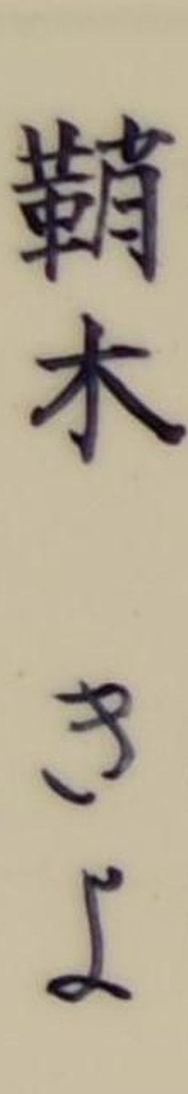鞘木きよ
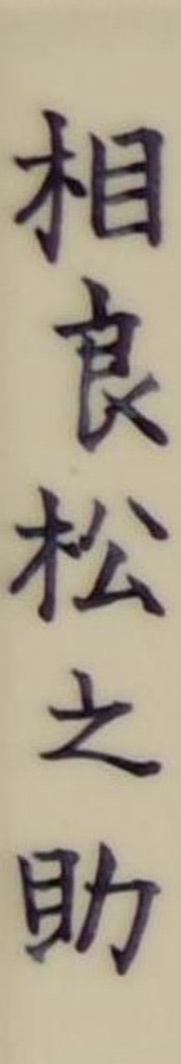相良松之助

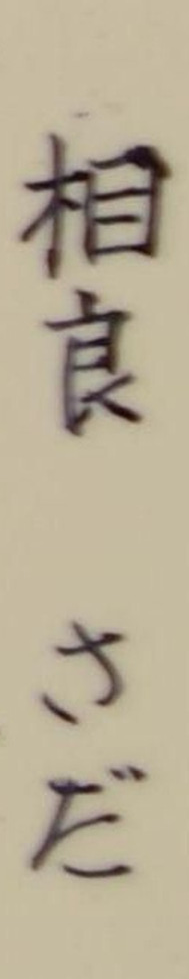相良さだ
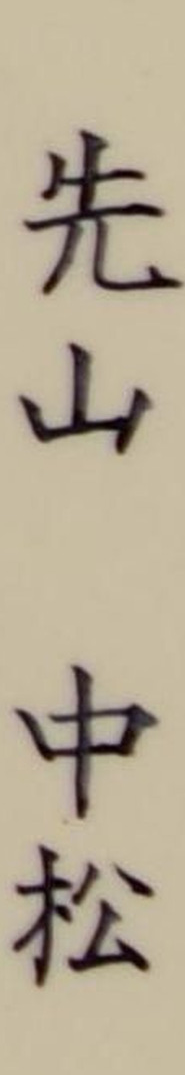先山中松
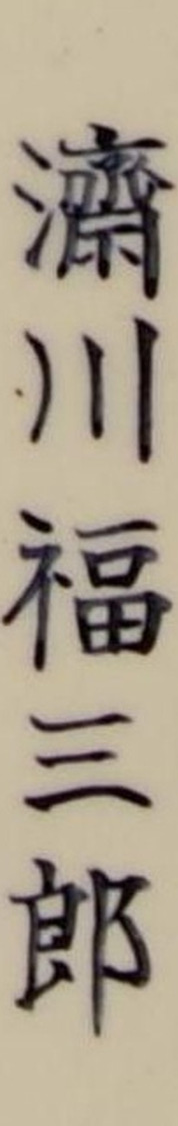濟川福三郎
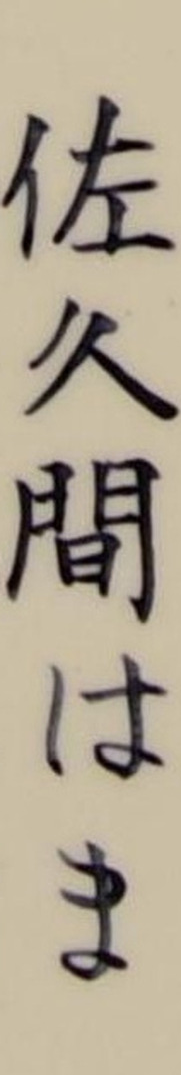佐久間はま
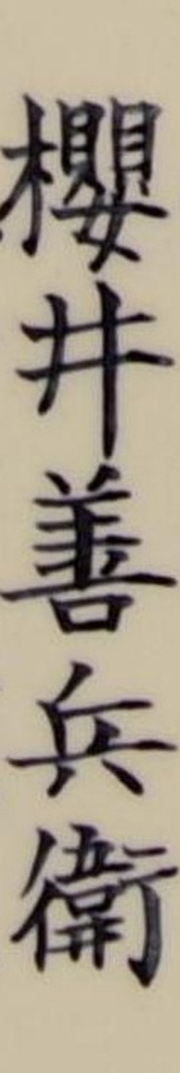桜井善兵衛
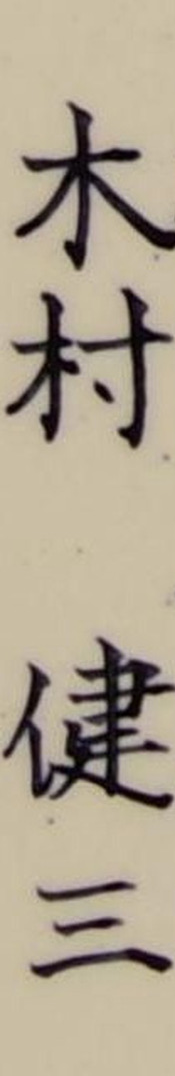木村健三
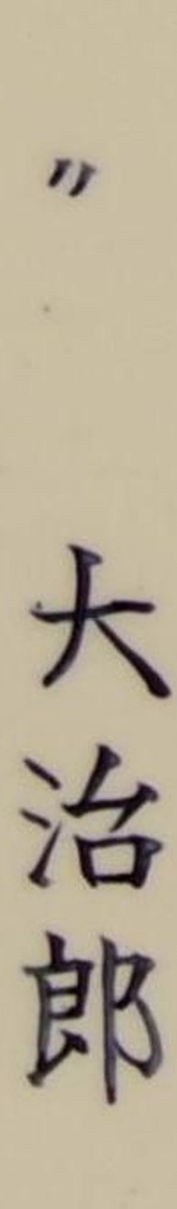大治郎
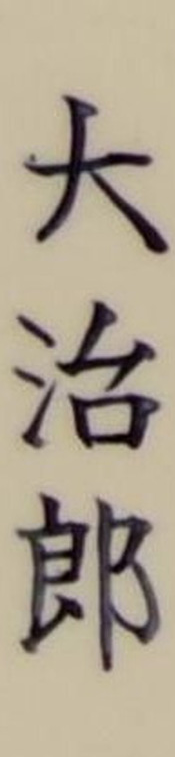大治郎
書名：E~L
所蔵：高野山金剛峯寺
